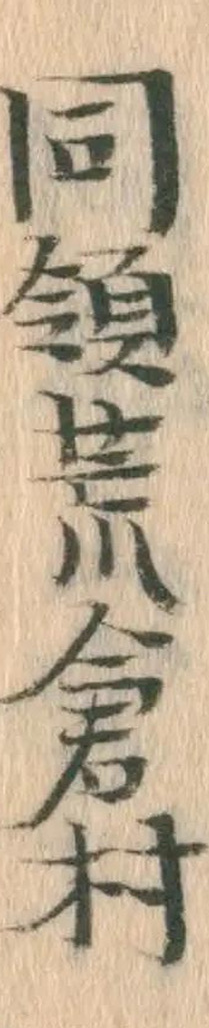同領荒倉村
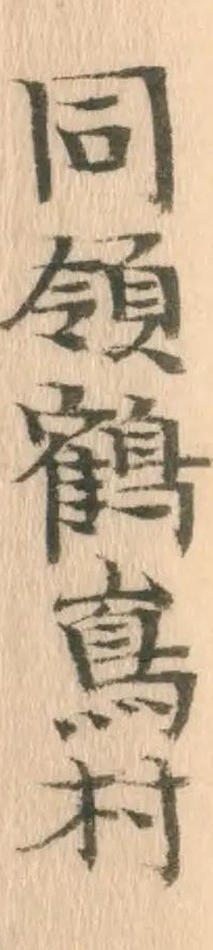同領鶴嶋村

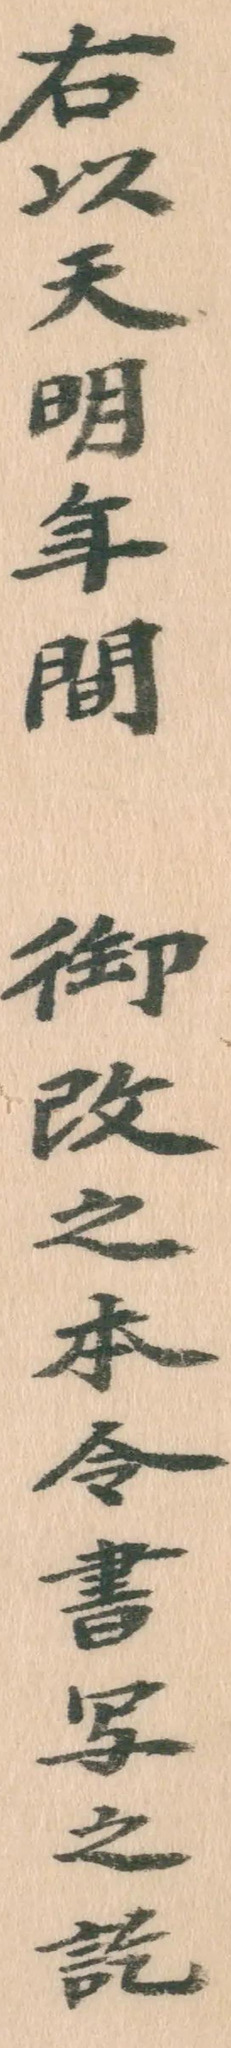右以天明年間御改之本令書写之訖
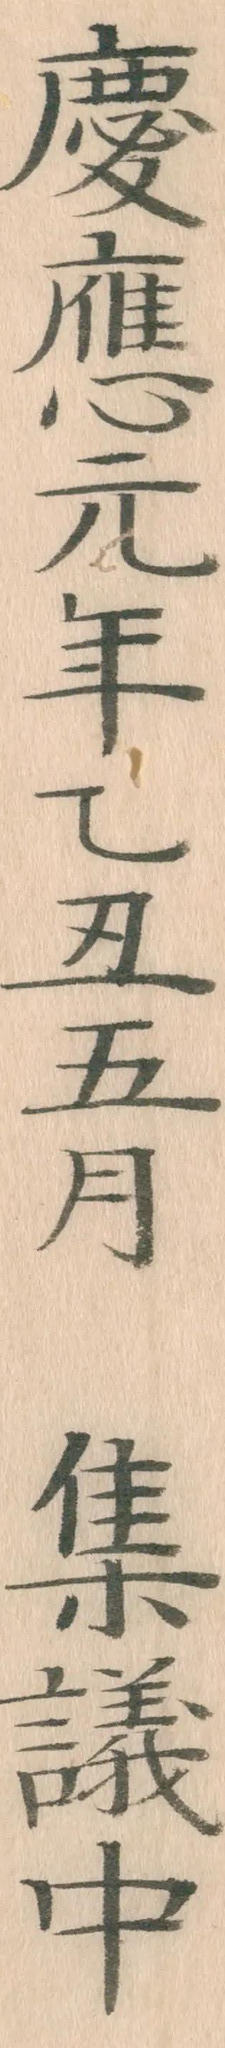慶応元年乙丑五月集議中
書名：古義真言宗本末帳 21巻. [4] 第三 伊賀国、伊勢国、志摩国、尾張国、三河国、遠江国、駿河国、伊豆国、甲斐国
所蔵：国立国会図書館 National Diet Library, JAPAN
